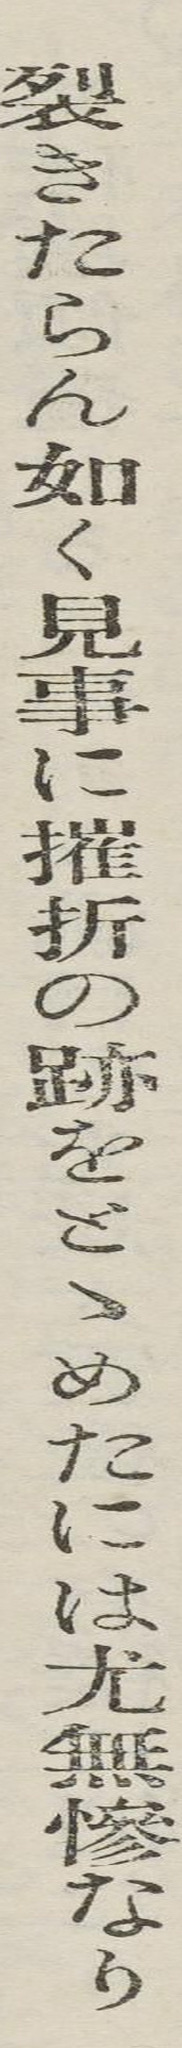裂きたらん如く見事に摧折れの跡をとゝめたには尤無惨なり
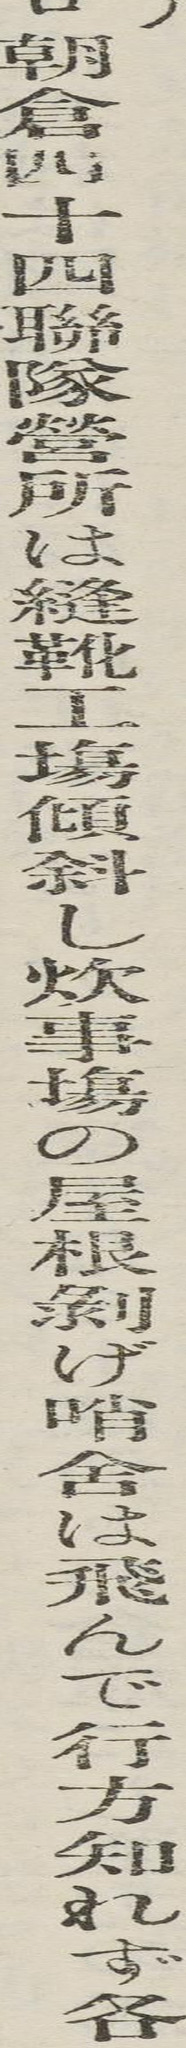朝倉四十四連隊営所は縫靴工場傾斜し炊事場の屋根剥げ哨舎は飛んで行方知れず各
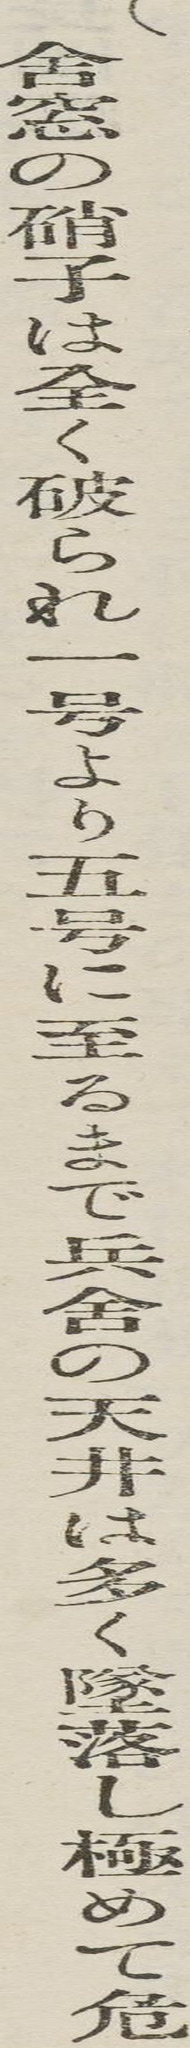舎窓の硝子は全く破られ一号より五号に至るまで兵舎の天井は多く墜落し極めて危
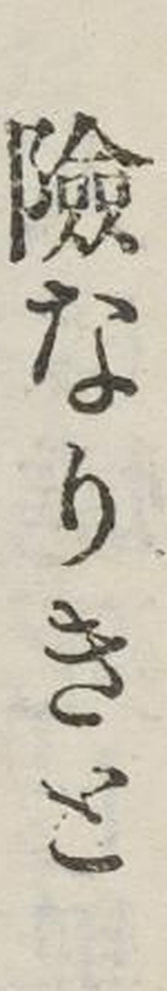険なりきと
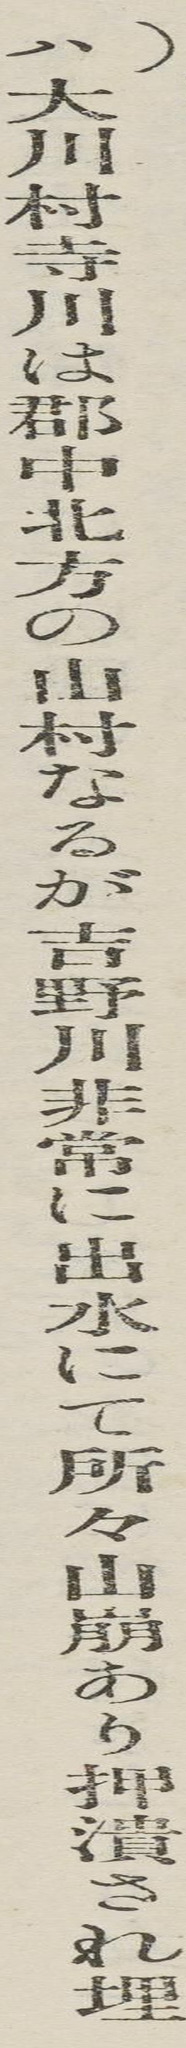大川村寺川は郡中北方の山村なるが吉野川非常に出水にて所々山崩あり押潰され埋
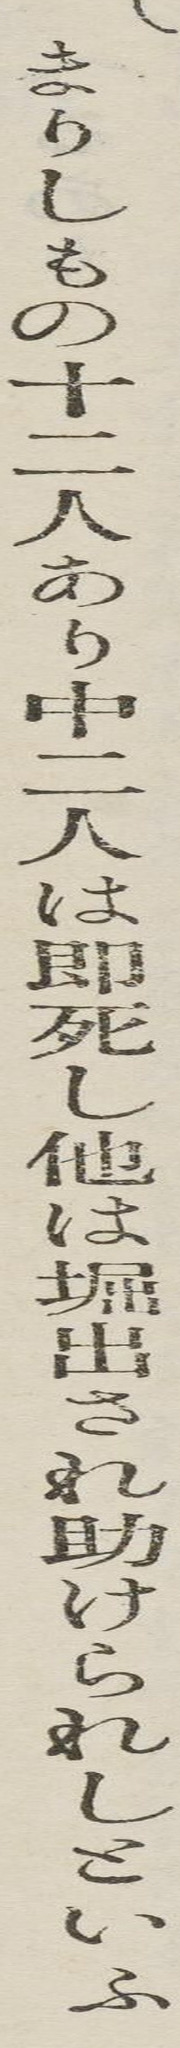まりしもの十二人あり中二人は即死し他は堀出され助けられしといふ
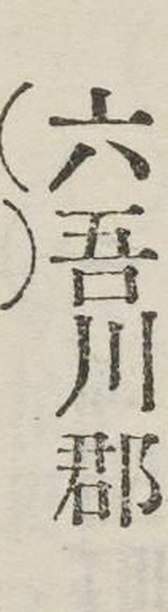吾川郡
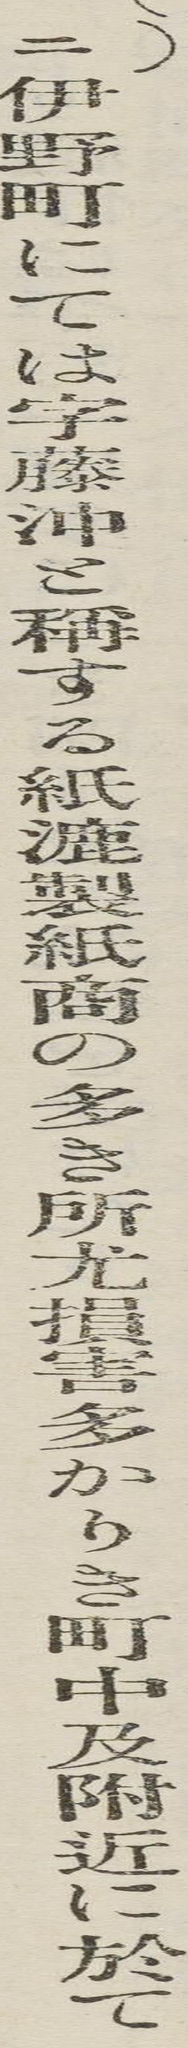伊野町にては字藤沖と称する紙漉製紙商の多き所尤損害多かりき町中及附近に於て
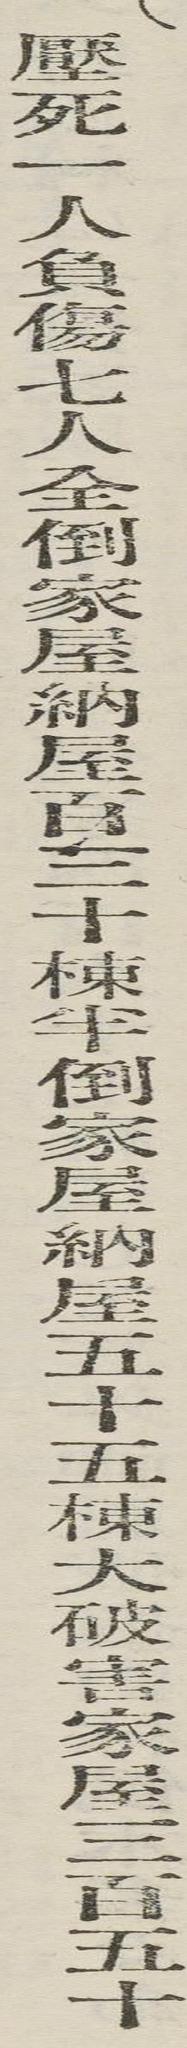圧死一人負傷七人全倒家屋納屋百三十棟半倒家屋納屋五十五棟大破害家屋三百五十
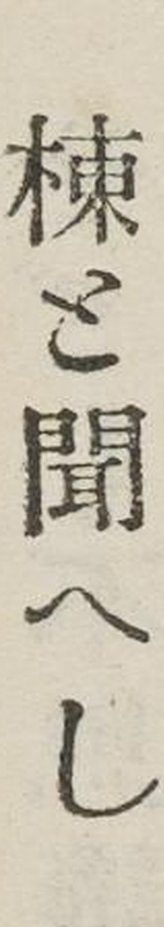棟と聞へし
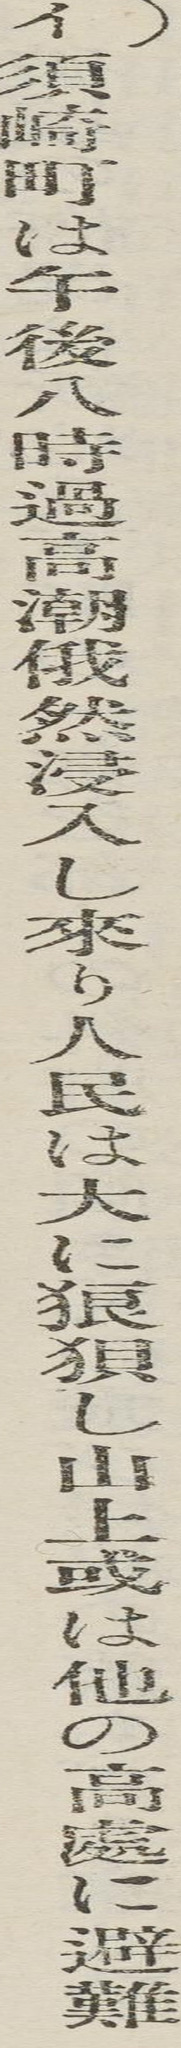須崎町は午後八時過高潮俄然侵入し来り人民は大に狼狽し山上或は他の高処に避難
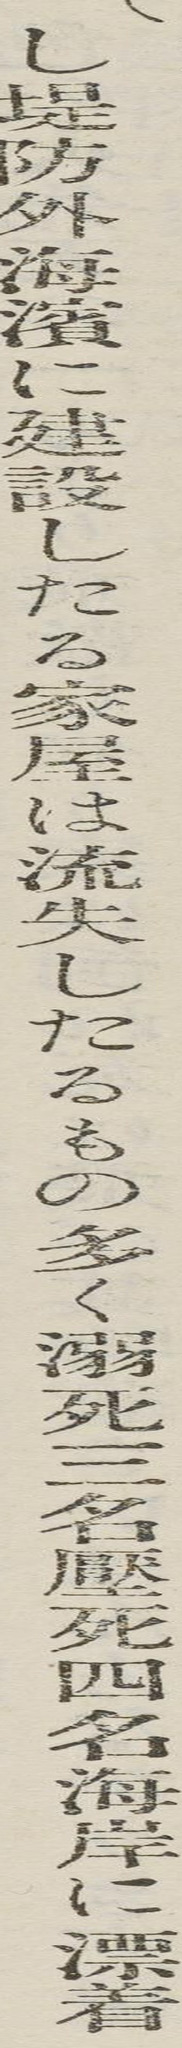し堤防外海浜に建設したる家屋は流失したるもの多く溺死三名圧死四名海岸に漂着
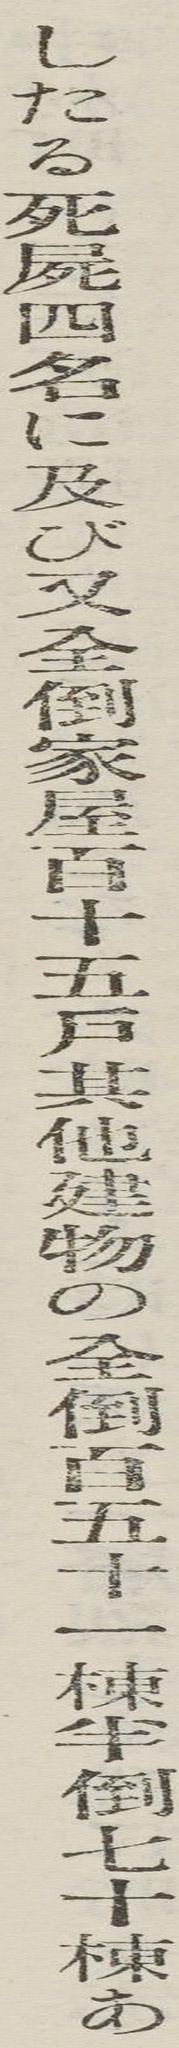したる死屍四名に及び又全倒家屋百十五戸其他建物の全倒百五十一棟半倒七十棟あ
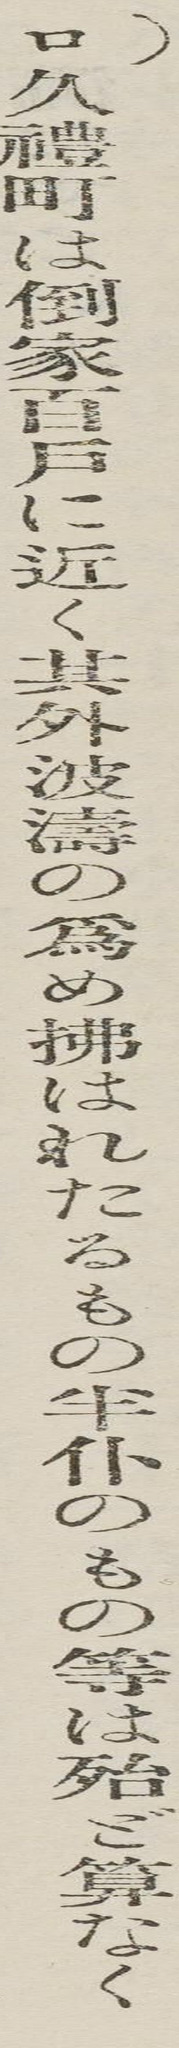久礼町は倒家百戸に近く其外波濤の為め払はれたるもの半仆のもの等は殆ど算なく
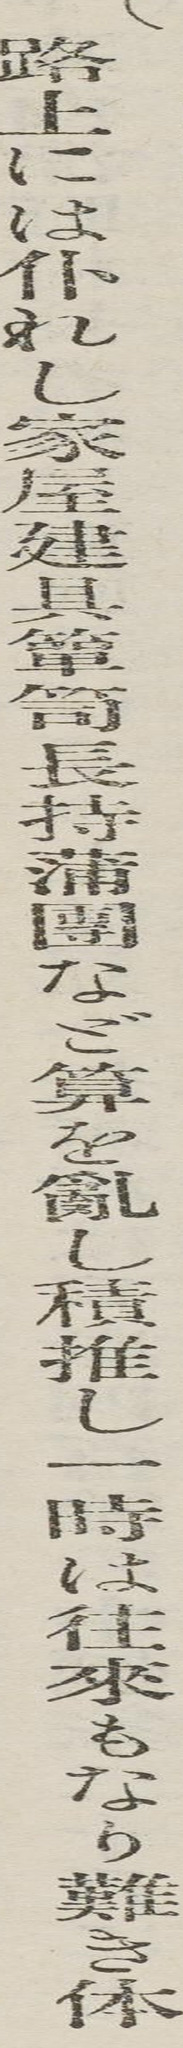路上には仆れし家屋建具箪笥長持蒲団など算を乱し積推し一時は往来もなり難き体
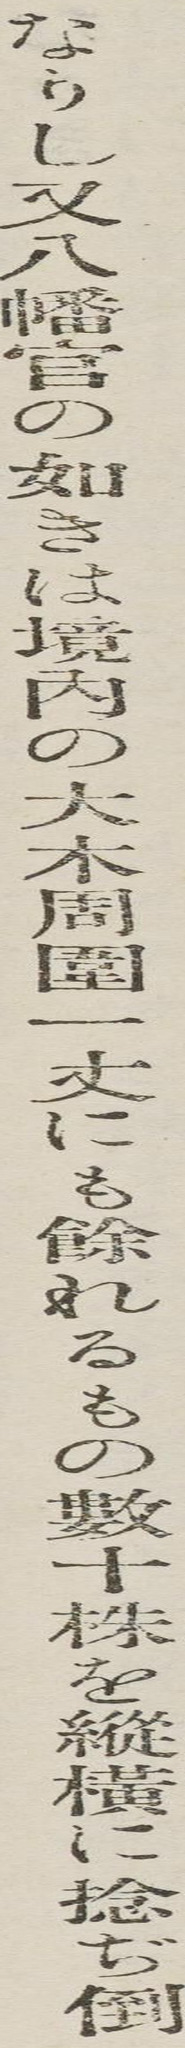なりし又八幡宮の如きは境内の大木周囲一丈にも余れるもの数十株を縦横に捻ぢ倒
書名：土佐古今ノ地震
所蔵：東京大学地震研究所図書室 Earthquake Research Institute Library, The University of Tokyo, JAPAN
